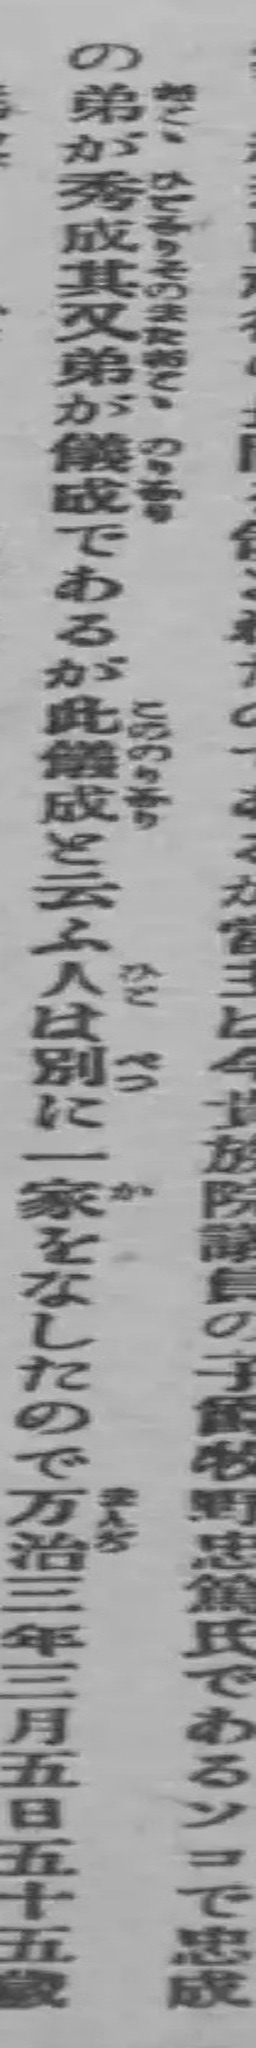の弟が秀成其又弟が儀成であるが此儀成と云ふ人は別に一家をなしたので万治三年三月五日五十五歳
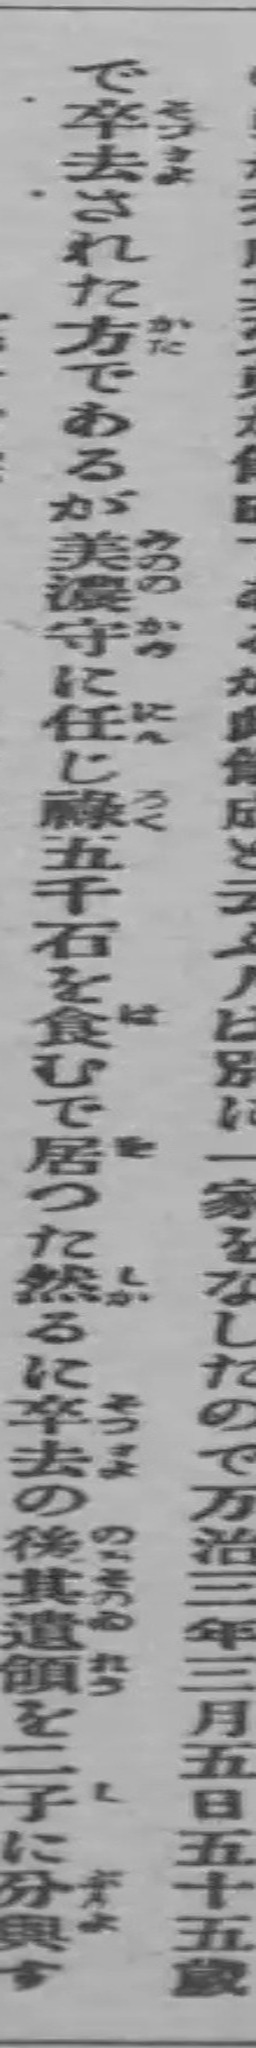で卒去された方であるが美濃守に任じ禄五千石を食むで居つた然るに卒去の後其遺領を二子に分与す
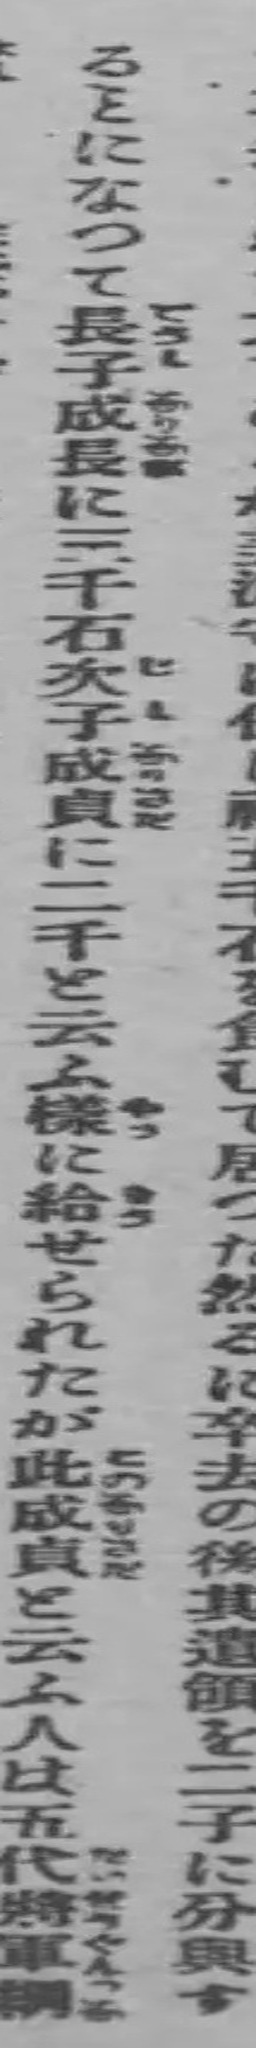牧野成貞ることになつて長子成長に三千石次子成貞に二千と云ふ様に給せられたが此成貞と云ふ人は五代将軍綱
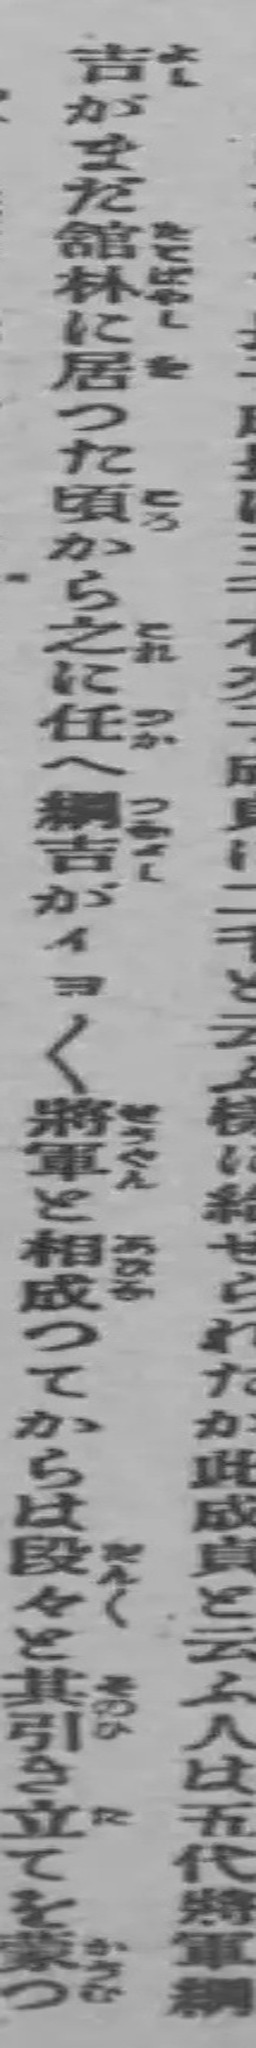吉がまだ舘林に居つた頃から之に仕へ綱吉がイヨ〳〵将軍と相成つてからは段々と其引き立てを蒙つ
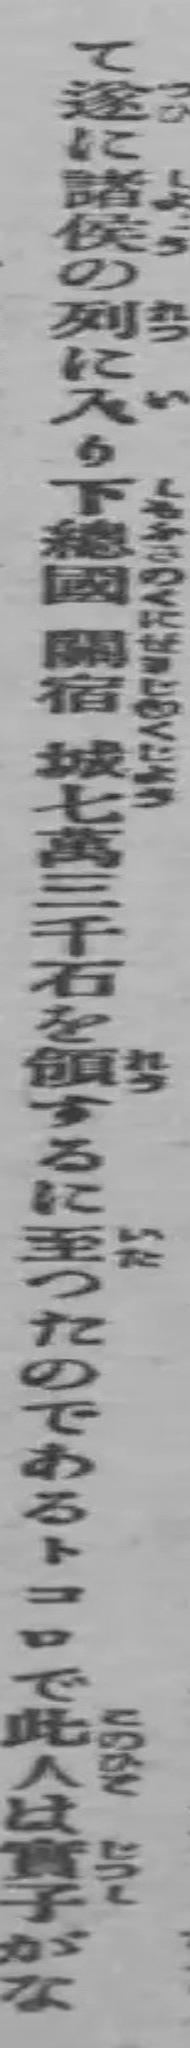て遂に諸侯の列に入り下総国関宿城七万三千石を領するに至つたのであるトコロで此人は実子がな
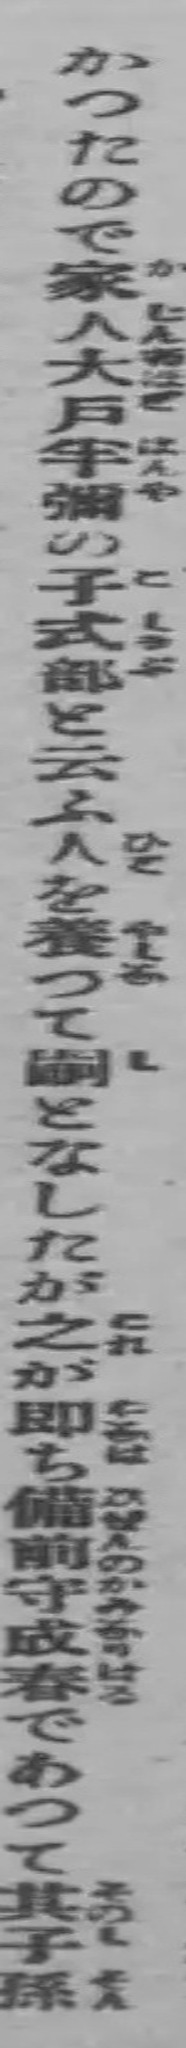笠間牧野家かつたので家人大戸半弥の子式部と云ふ人を養つて嗣となしたが之が即ち備前守成春であつて其子孫
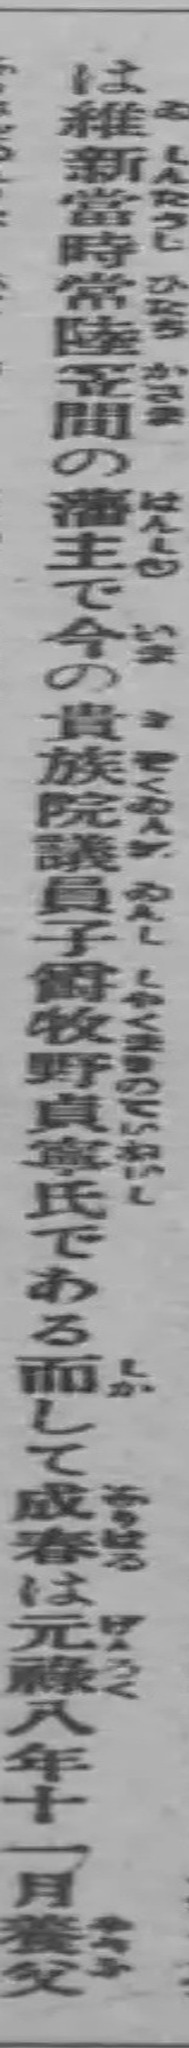は維新当時常陸笠間の藩主で今の貴族院議員子爵牧野貞寧氏である而して成春は元禄八年十一月養父
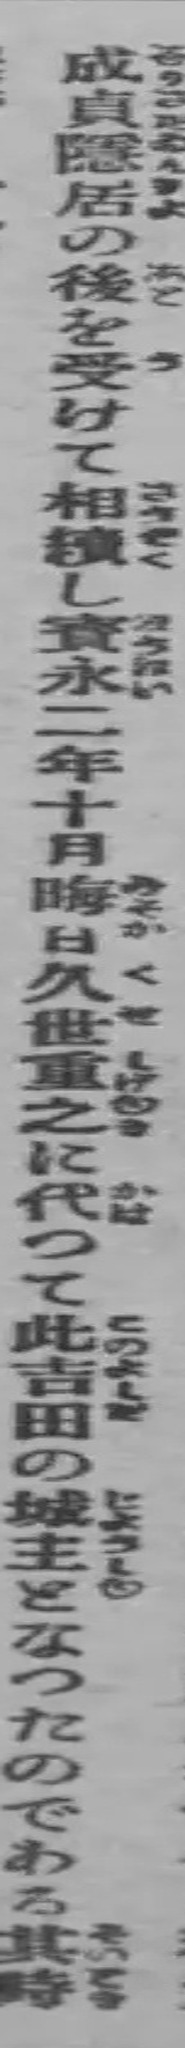成貞隠居の後を受けて相続し宝永二年十月晦日久世重之に代つて此吉田の城主となつたのである其時
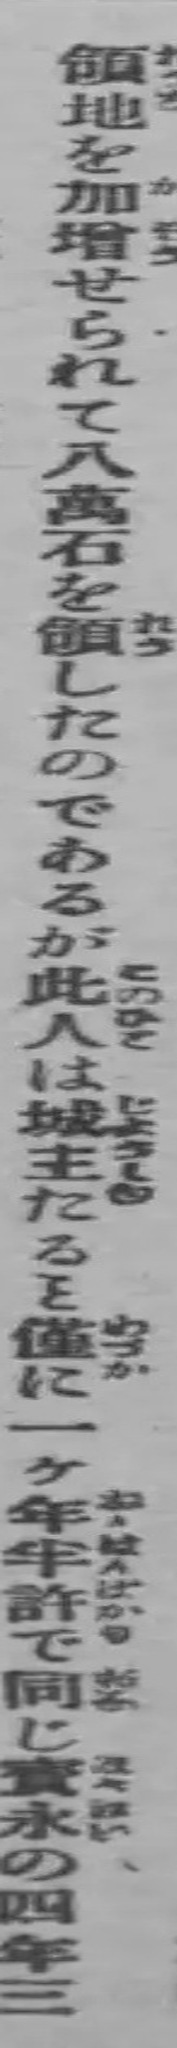領地を加増せられて八万石を領したのであるが此人は城主たること僅に一ケ年半許で同じ宝永の四年三
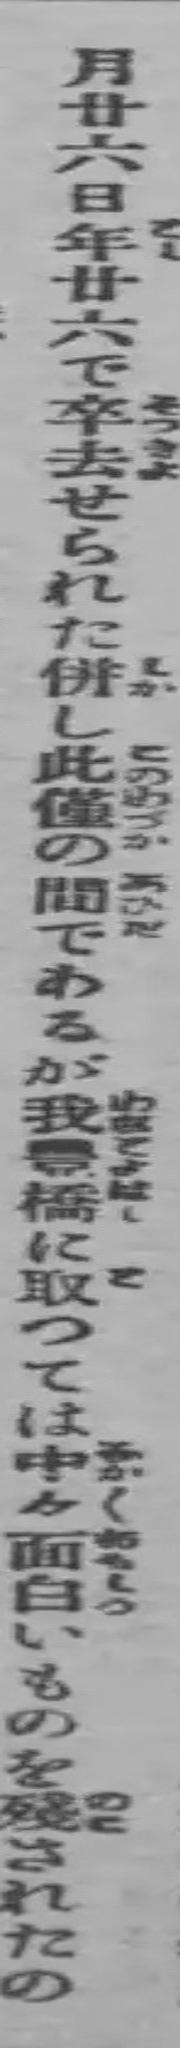月廿六日年廿六で卒去せられた併し此僅の間であるが我橋に取つては中々面白いものを残されたの
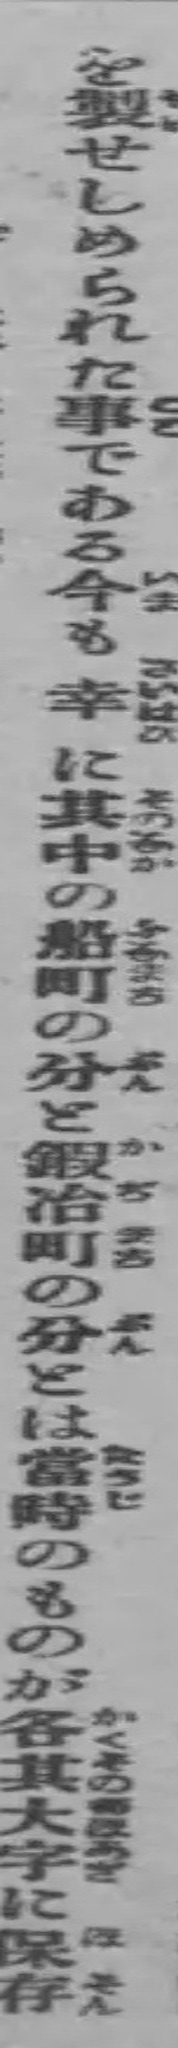を製せしめられた事である今も幸に其中の船町の分と鍛冶町の分とは当時のものが各其大字に保存
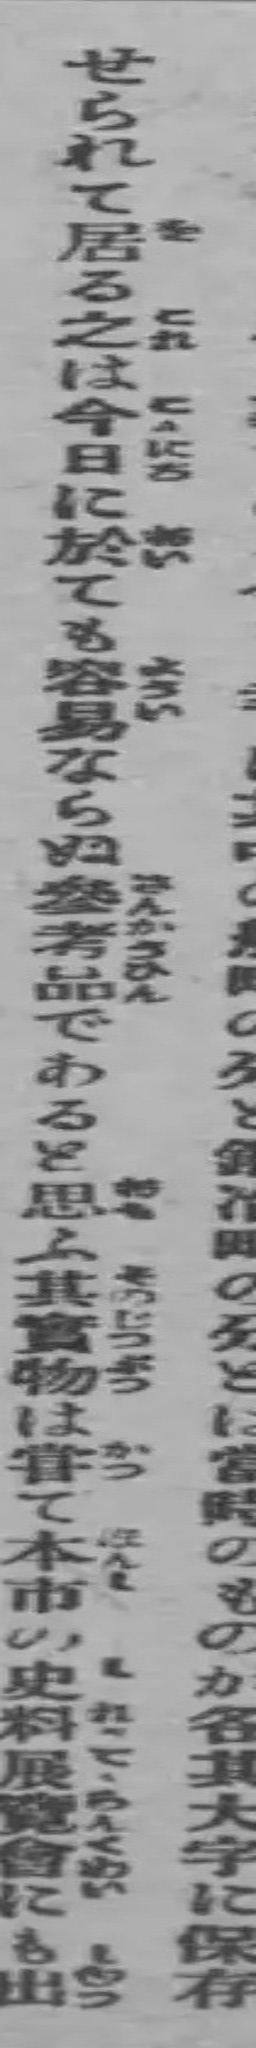せられて居る之は今日に於ても容易ならぬ参考品であると思ふ其実物は嘗て本市の史料展覧会にも出
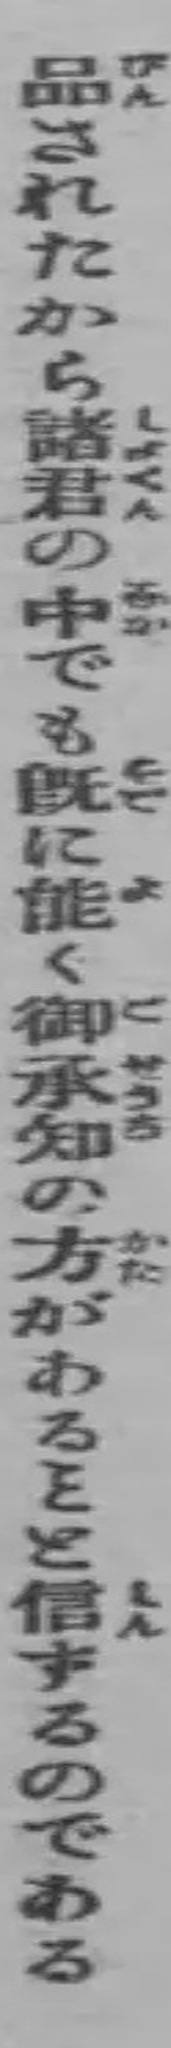品されたから諸君の中でも既に能く御承知の方があることと信ずるのである
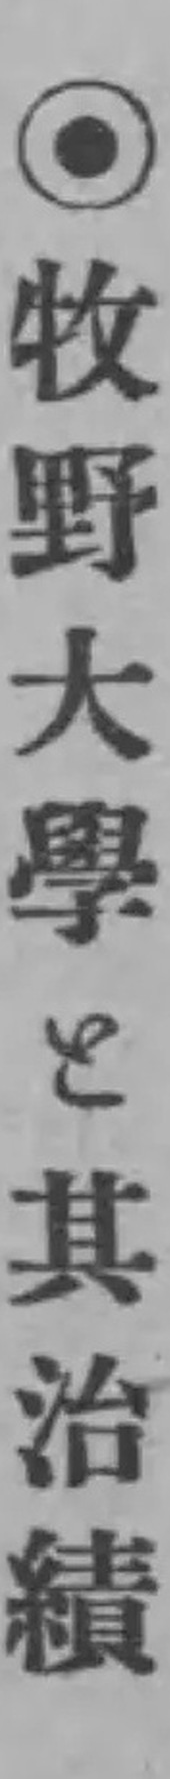⦿牧野大学と其治績
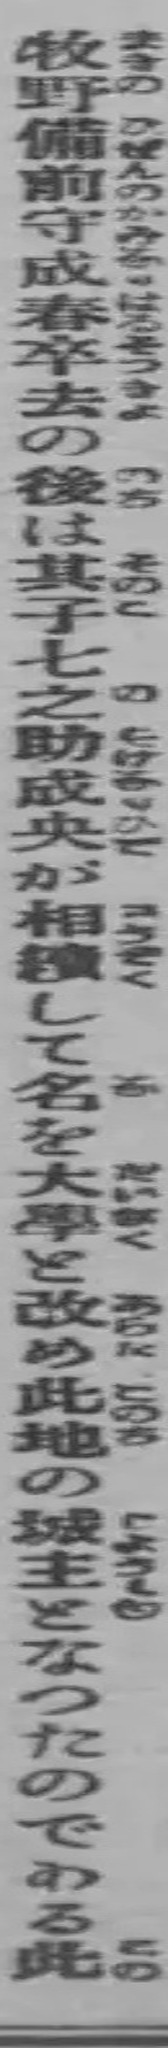牧野成春牧野備前守成春卒去の後は其子七之助成央が相続して名を大学と改め此地の城主となつたのである此
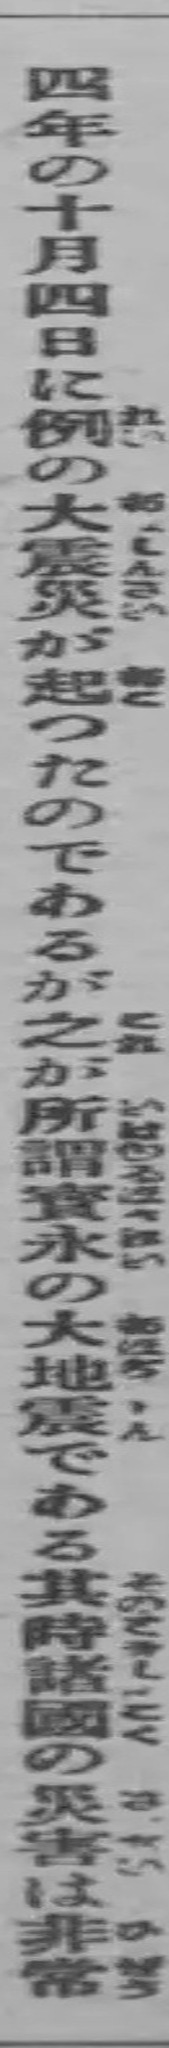四年の十月四日に例の大震災が起つたのであるが之が所謂宝永の大地震である其時諸国の災害は非常
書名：豊橋市史談
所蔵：国立国会図書館 National Diet Library, JAPAN
